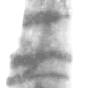三
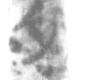{禾癸}
